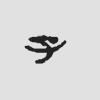子
